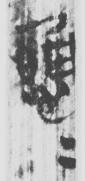{唯心}
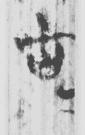古=
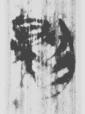則
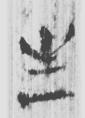生
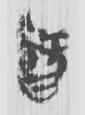智
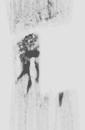眾
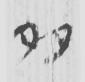多
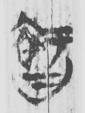智
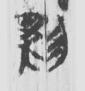則
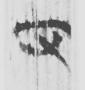反
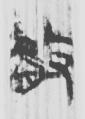{㐭攴}
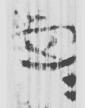正=
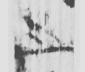之
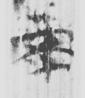不
